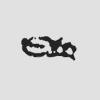爲
